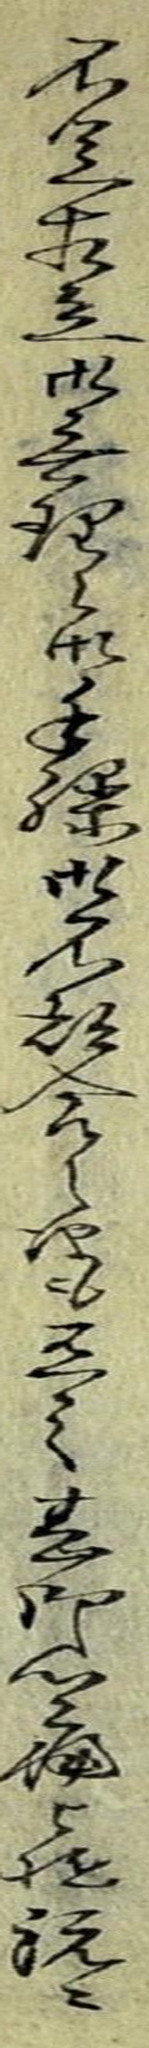不足相立御無理之御手繰御不都合之儀も有之甚御心痛被遊既に
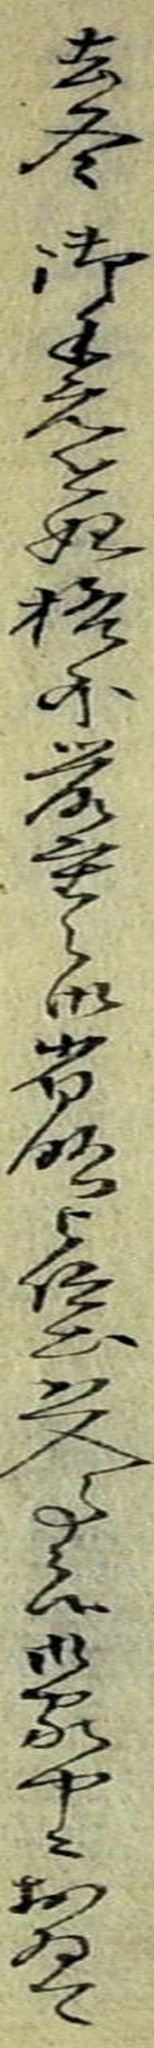去冬御手元を始格外厳重之御省略被仰出恐入事に候御家中におゐて
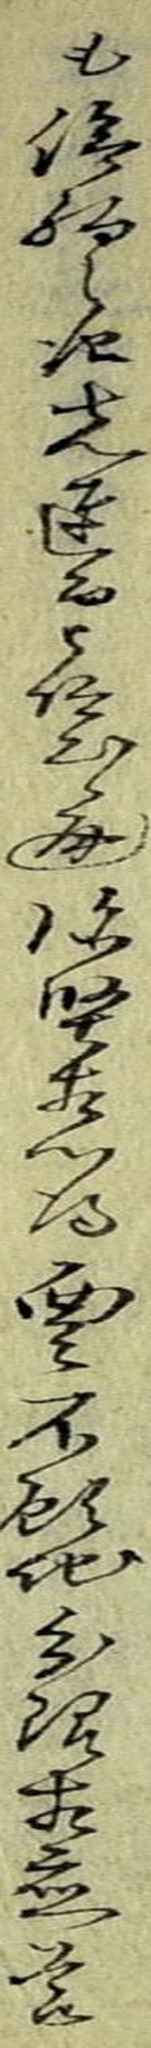も倹約之儀先達而被仰出候通弥堅相心得面々不顧他分限相応節
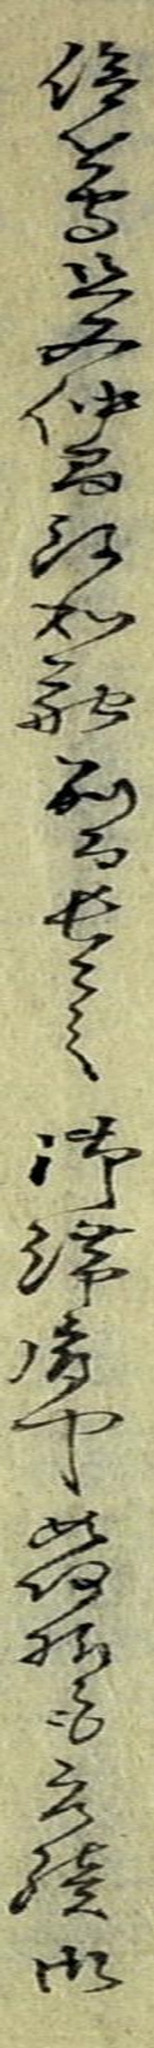倹を守且又仲間致和融別而長々之御滞府中如何様にも取続御
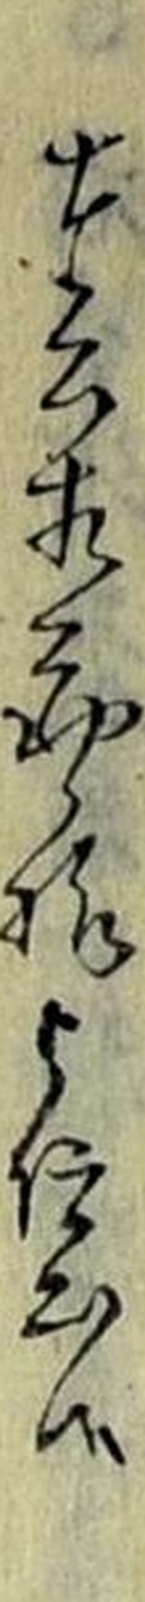奉公相勤候様被仰出候
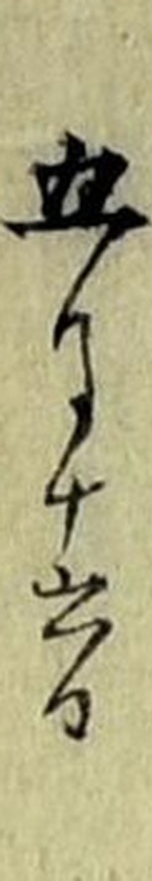五月十六日
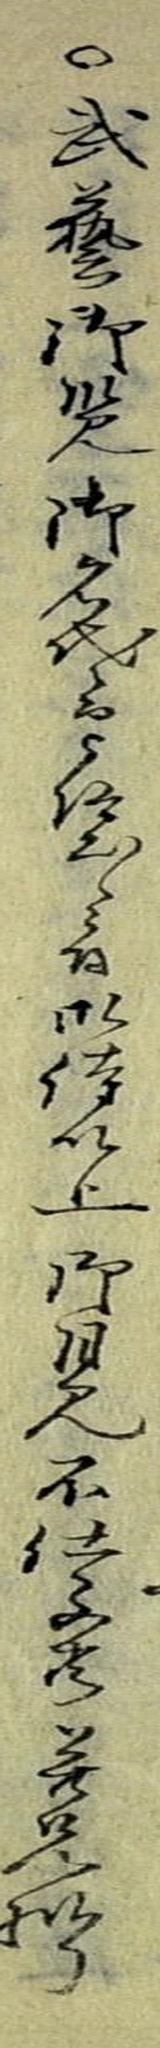○武芸御覧御名代に而被仰出候に付御侍以上御目見不仕子供并兄？掛り
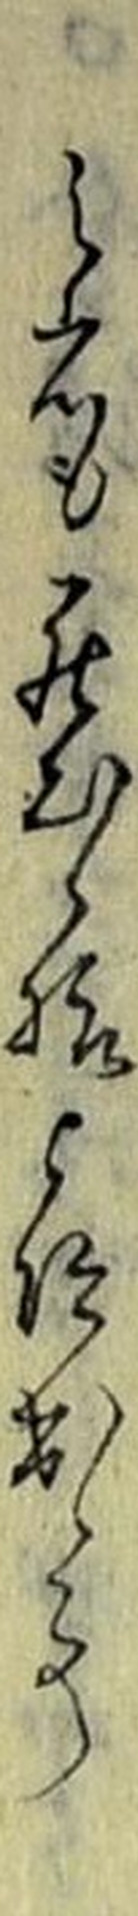之者も罷出候様被仰出候事
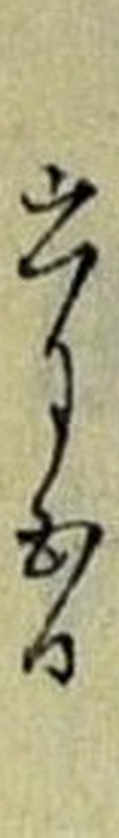六月五日
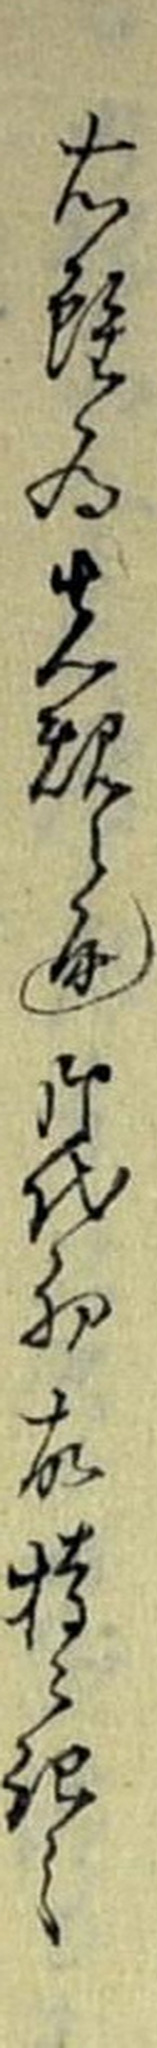右雖為先規之通御代初故特に記之
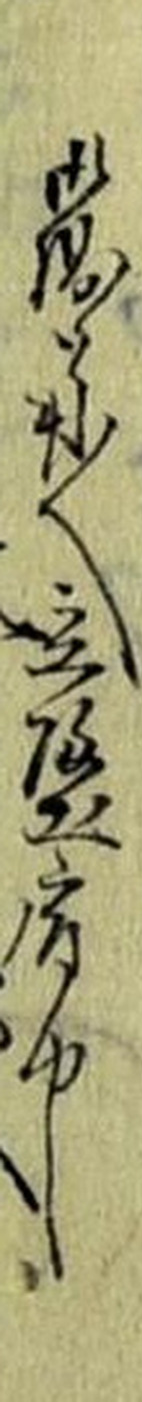御側御用人立帰出府中
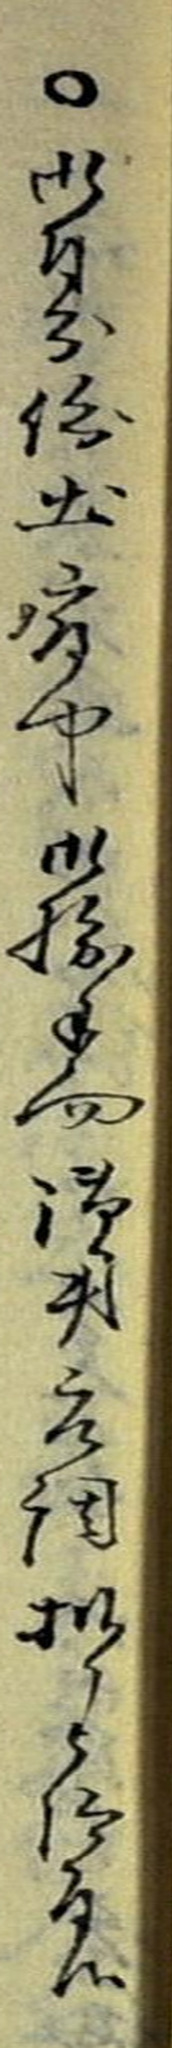○御自分儀出府中御勝手向御用取調掛り被仰付候
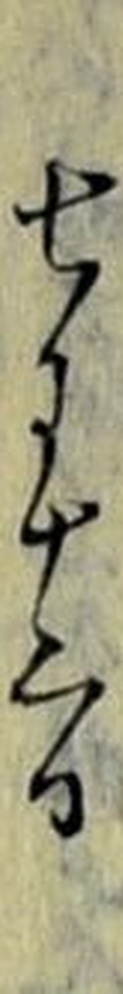七月十二日
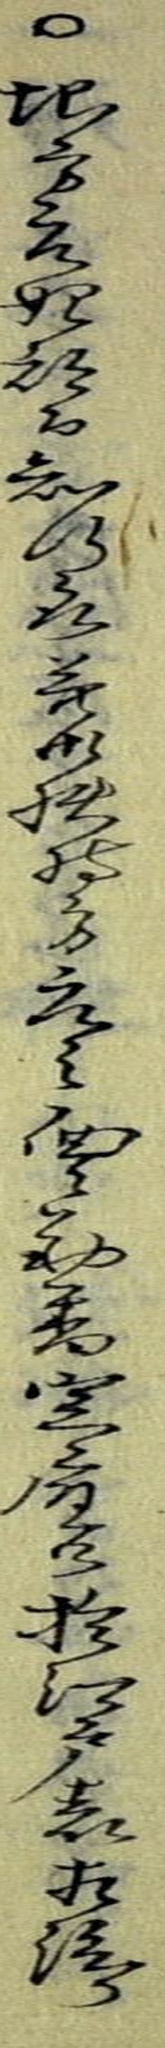○地方取始都而知行取并御扶持方取之面々勤番定府共於江戸表相渡り
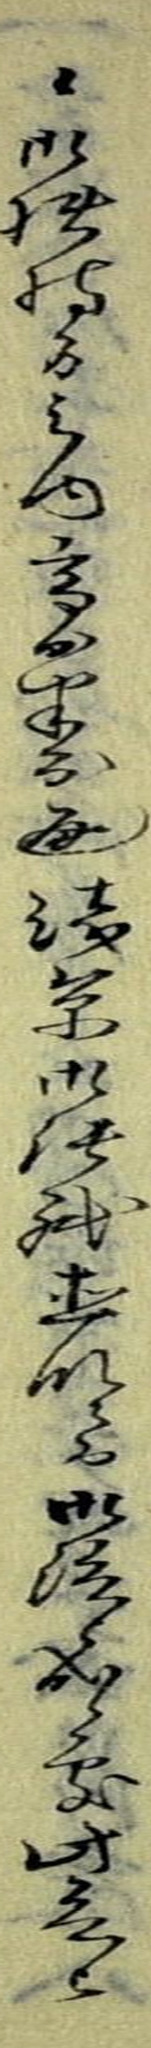候御扶持方之内高ゟ半分通浅草御張紙直段に而御渡被成候処此度被
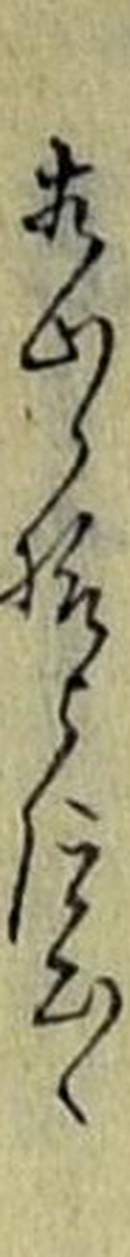相止候様被仰出候
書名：命令之部 六
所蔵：福井県文書館 Fukui Prefectural Archives
